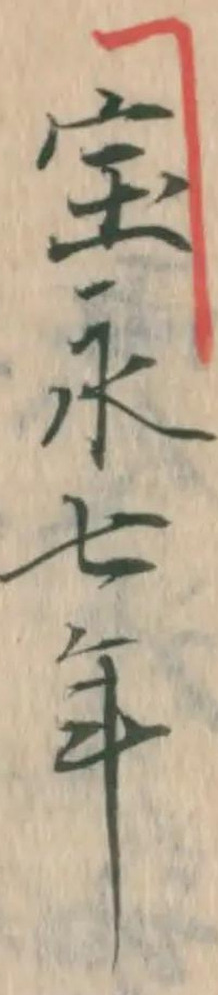宝永七年
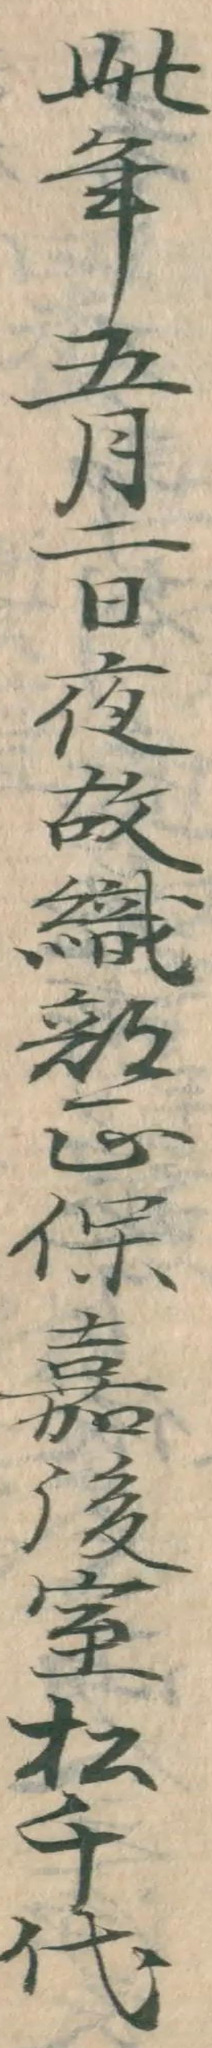此年五月二日夜故織部正保嘉後室松千代
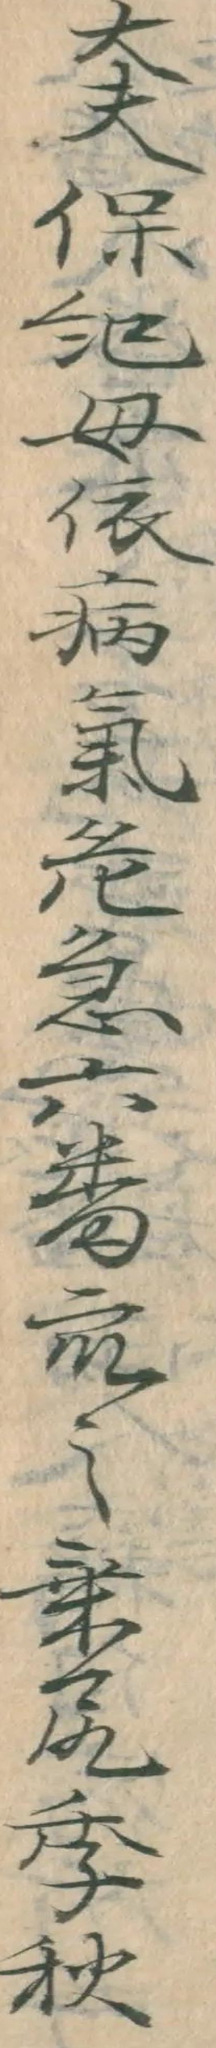大夫保紀母依病気危急六番衆之乗尻季秋

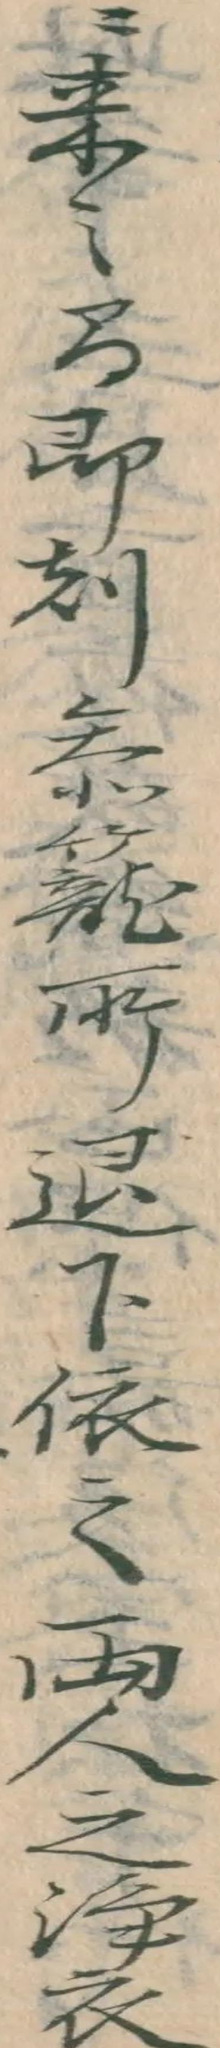ニ来之間即刻参籠所退下依之両人之浄衣
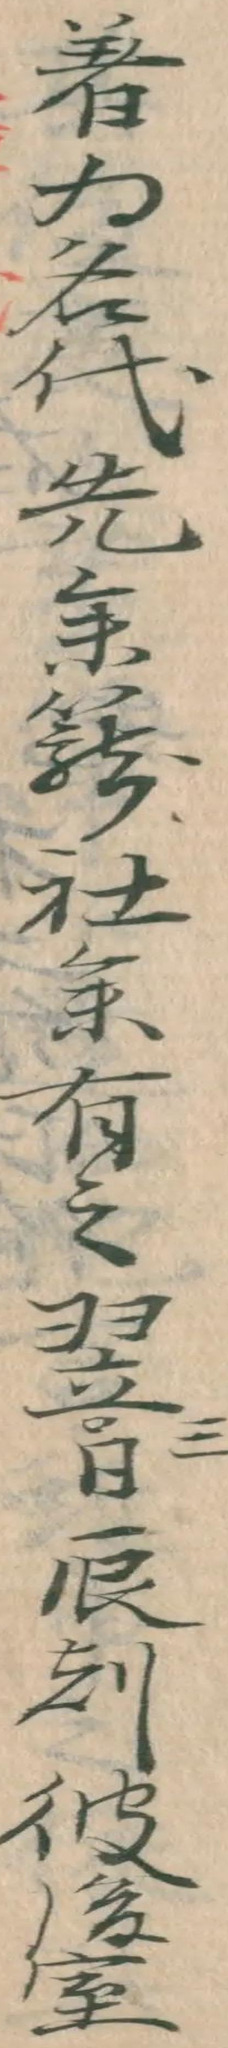着為名代先参籠社参有之翌￮日辰刻彼後室
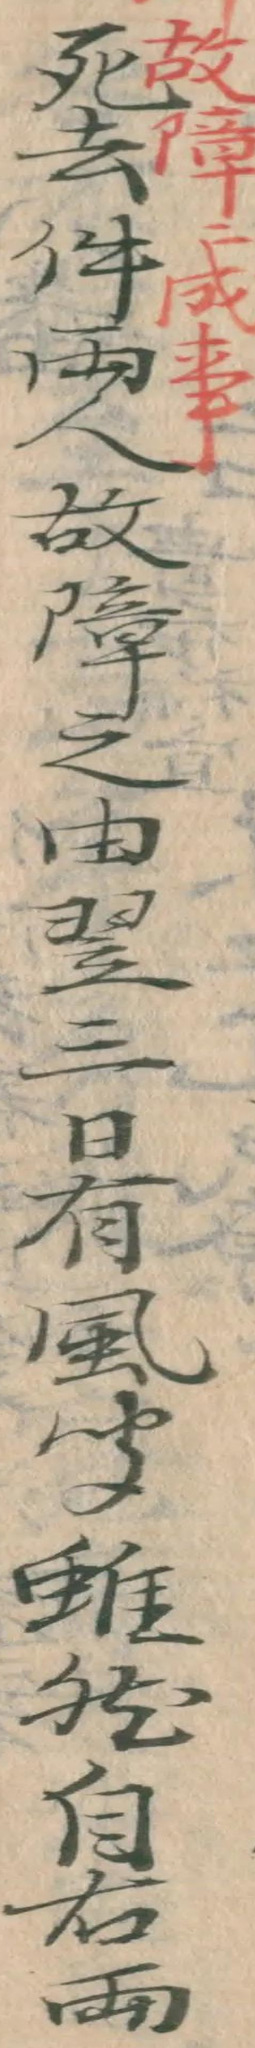死去件両人故障之由翌三日有風聞雖然自右両
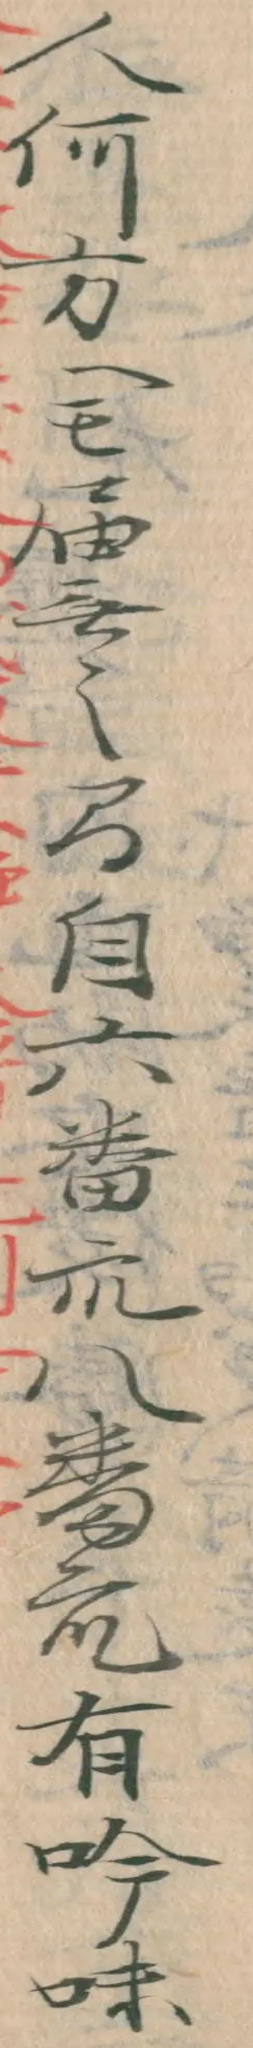人何方へモ届無之間自六番衆八番衆有吟味
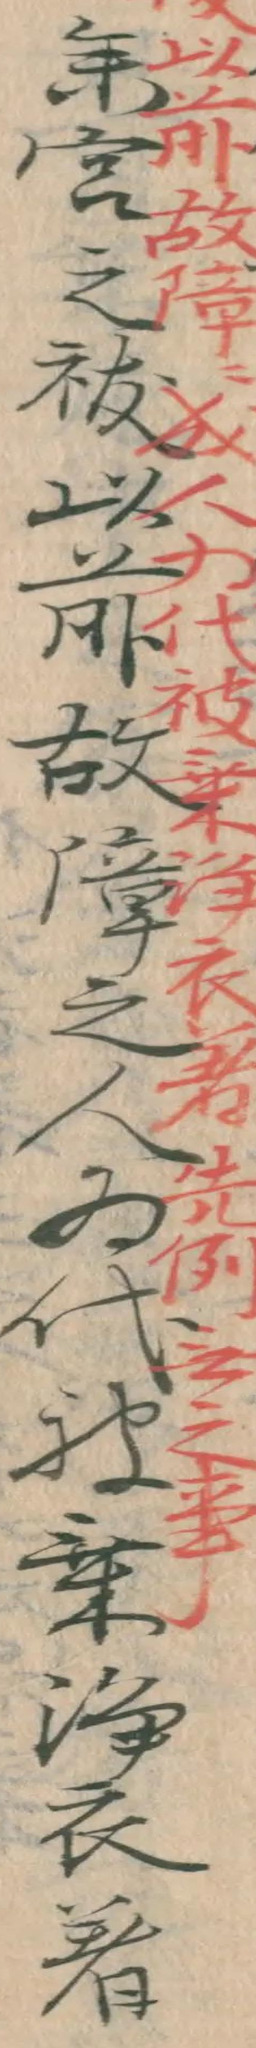参宮之祓以前故障之人為代被乗浄衣着
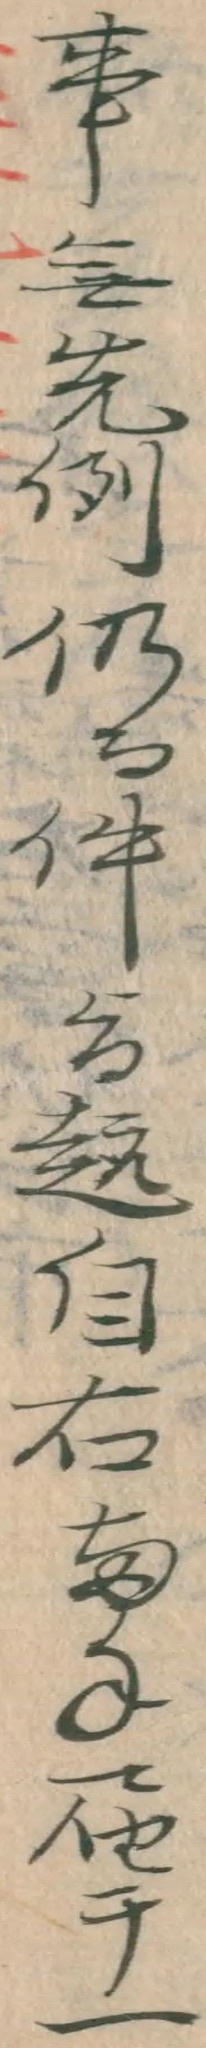事無先例仍而件旨趣自右両手届于一
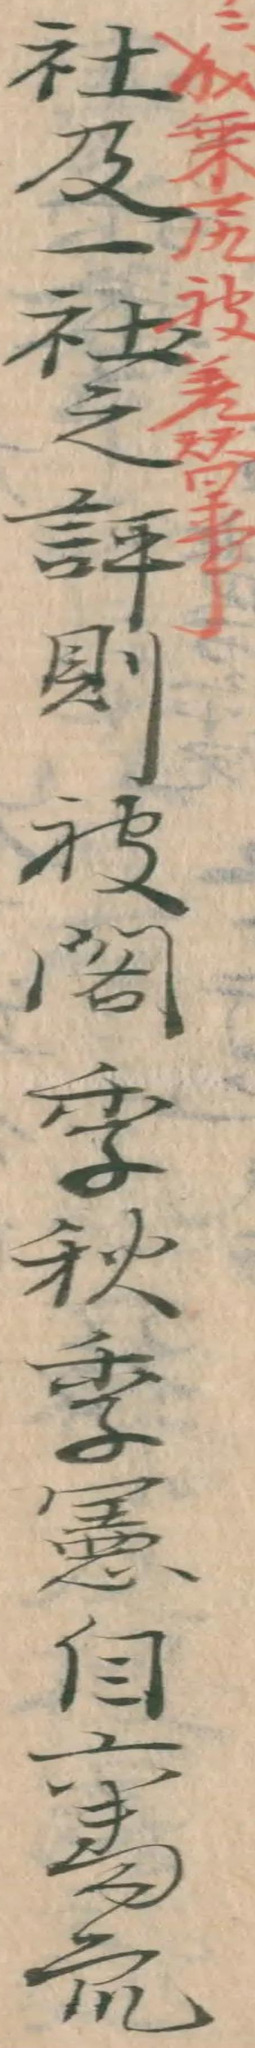社及一社之評則被閣季秋季憲自六番衆
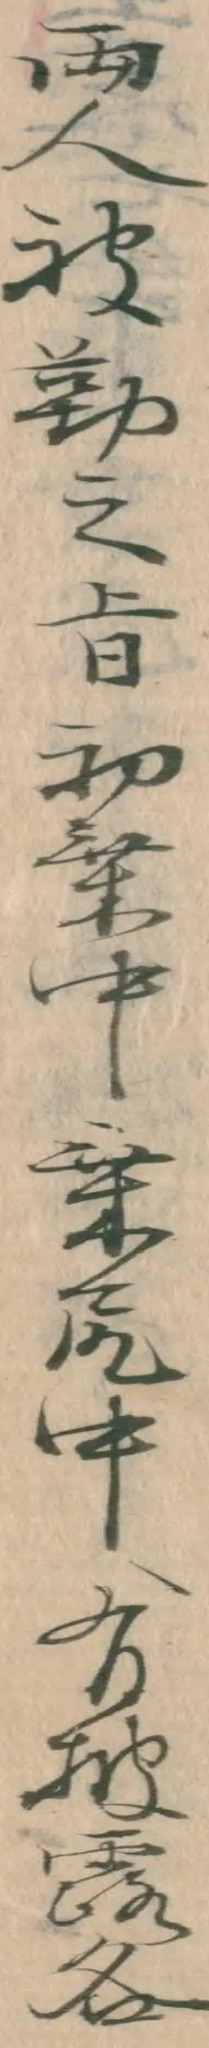両人被勤之旨初乗中乗尻中へ有披露各
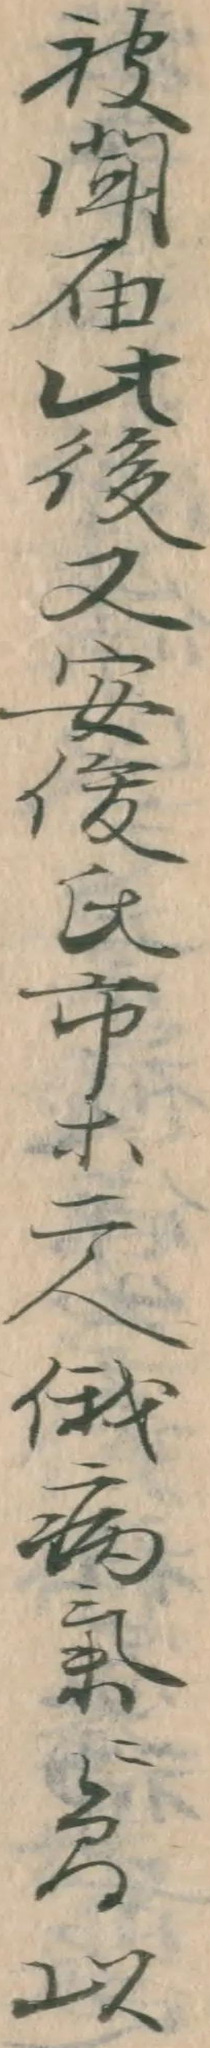被聞届此後又安俊氏市等二人俄病気ニ候間以
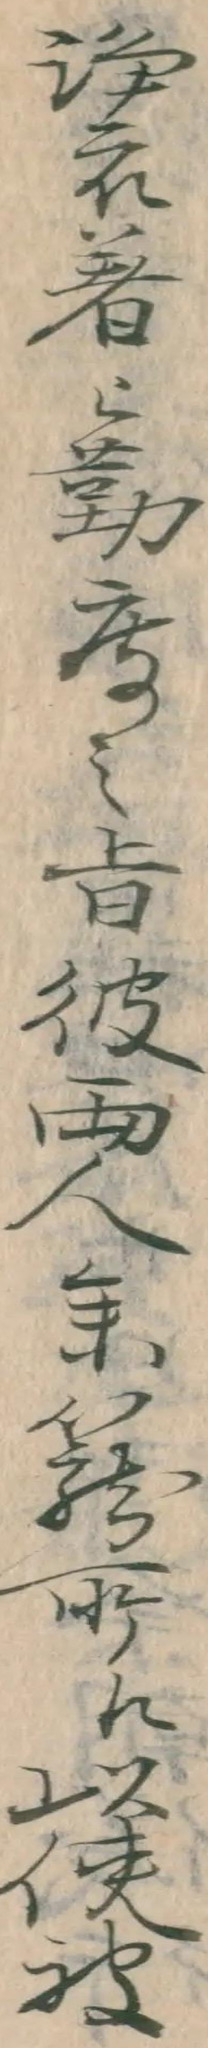浄衣着被勤度之旨彼両人参籠所江以使被
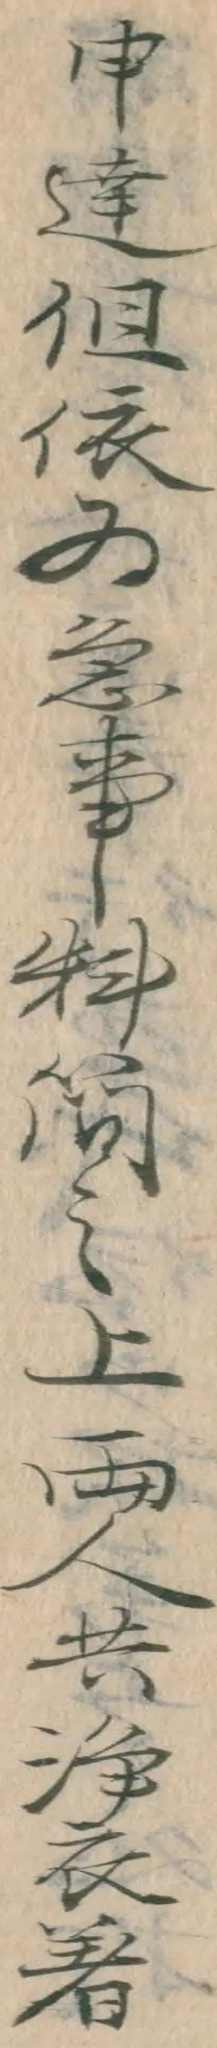申達但依為急事料簡之上両人共浄衣着
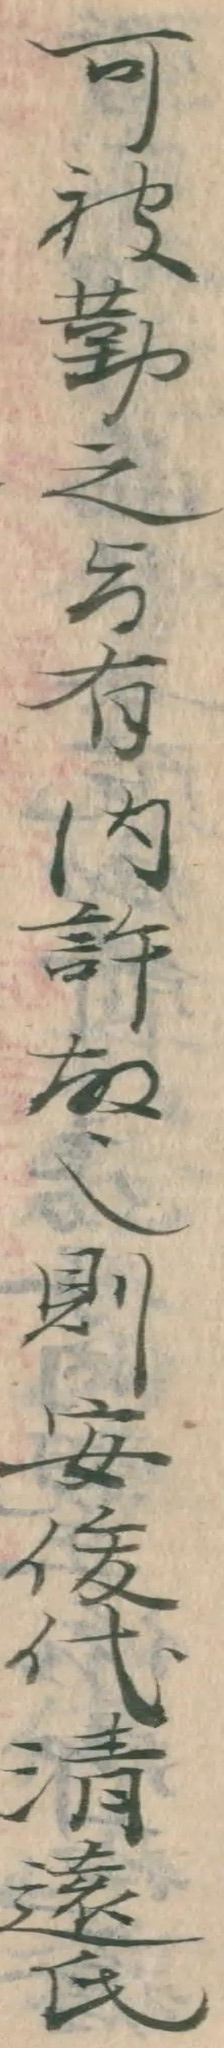可被勤之旨有内許故也則安俊代清遠氏
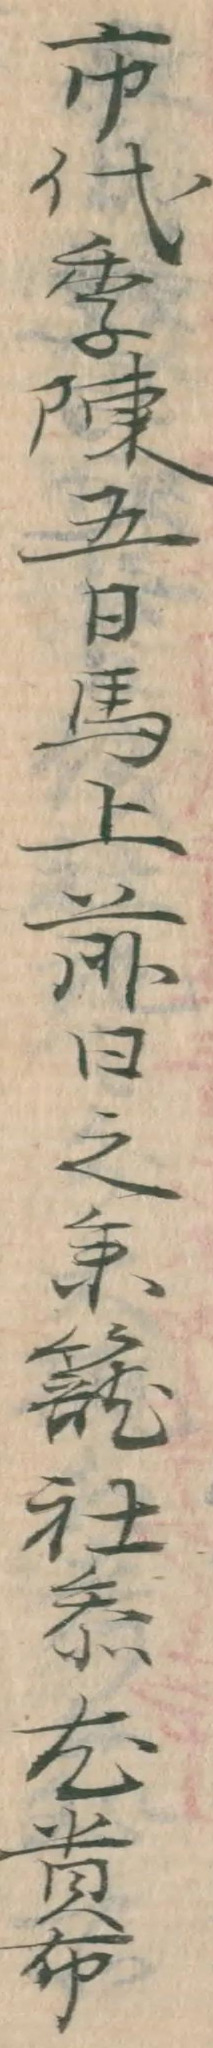市代季陳五日馬上前日之参籠社参尤賞布
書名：賀茂社記録. 第10冊
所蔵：国立国会図書館 National Diet Library, JAPAN
